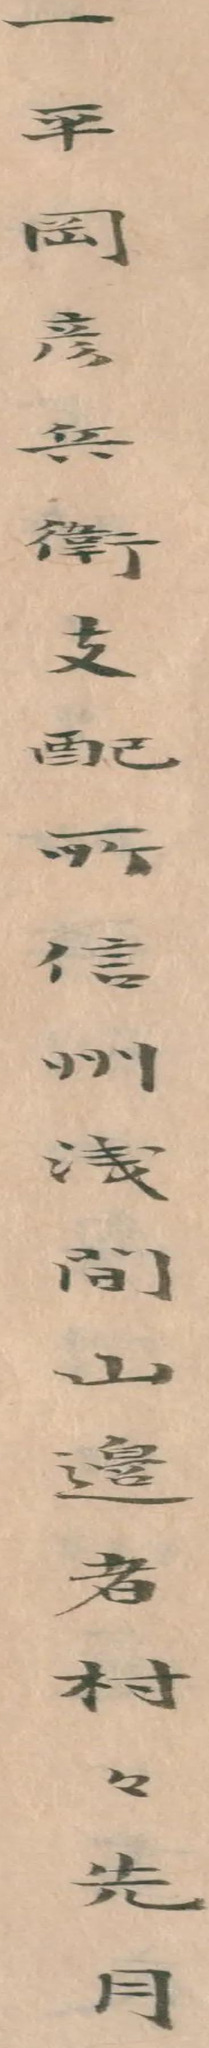一平岡彦兵衛支配所信州浅間山辺者村々先月
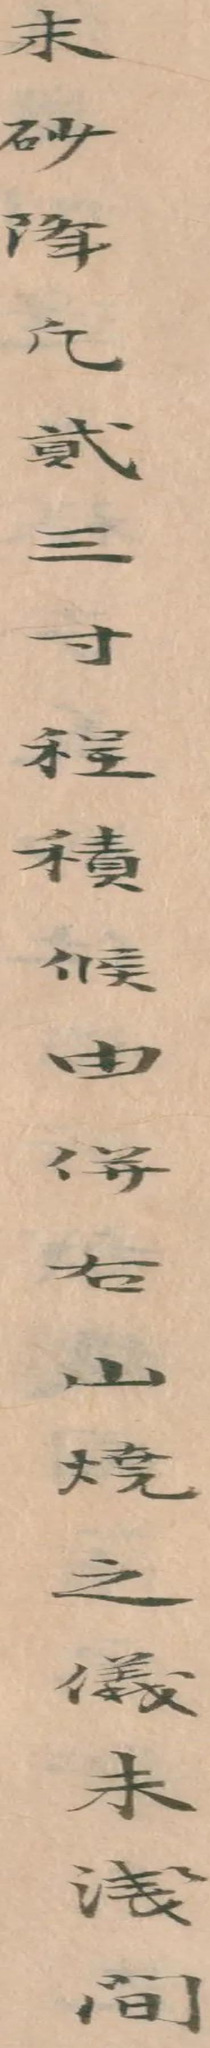未砂降凡弐三寸程積候由併右山焼之儀未浅間
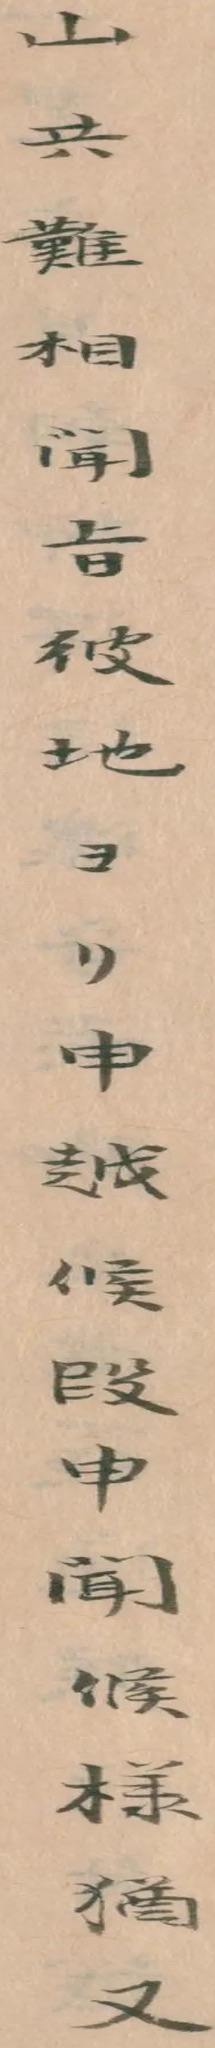山共難相聞旨彼地ヨリ申越候段申聞候様猶又
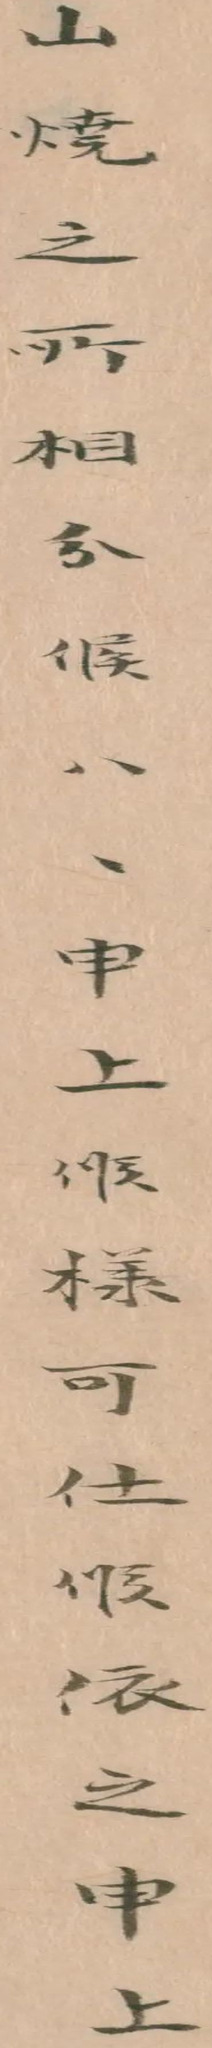山焼之所相分候ハゝ申上候様可仕候依之申上
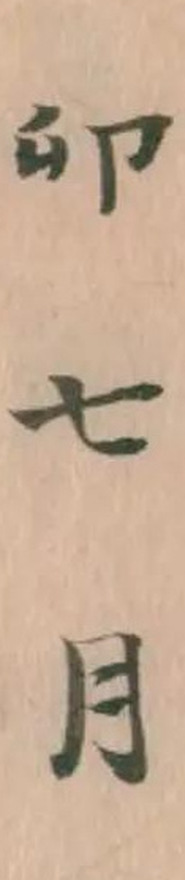卯七月
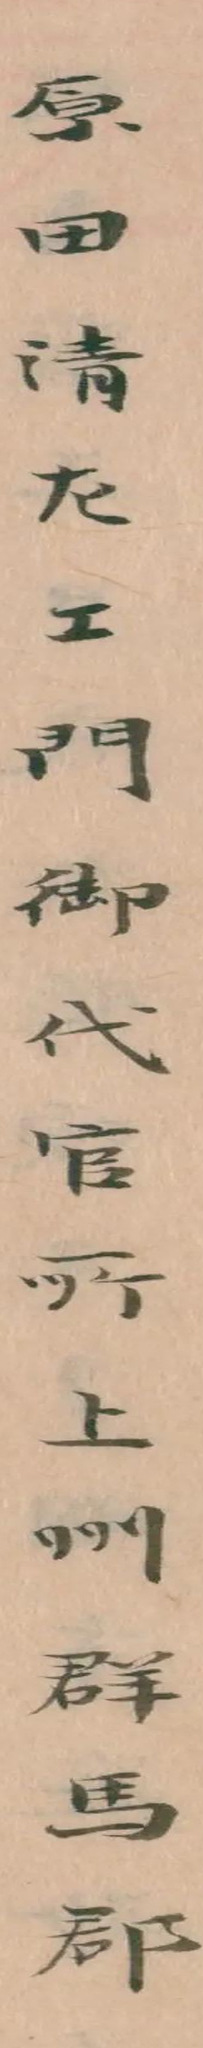原田清右衛門御代官所上州群馬郡
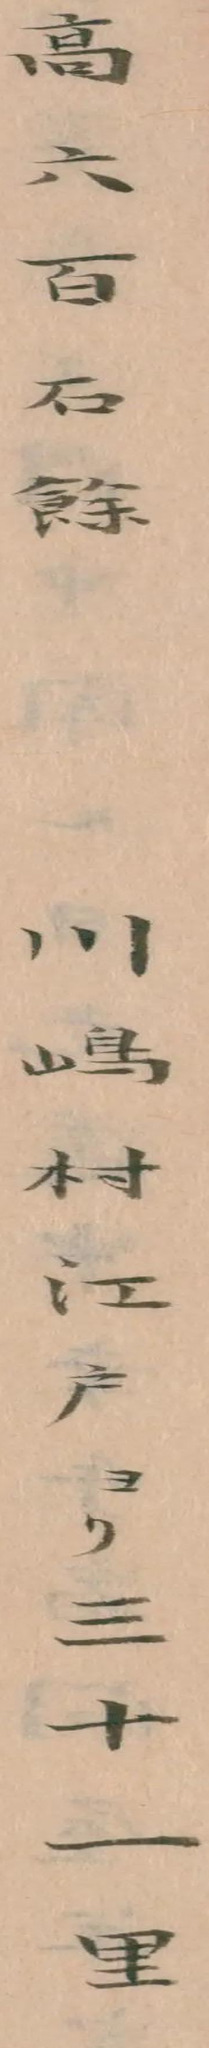高六百石余川嶋村江戸ヨリ三十一里
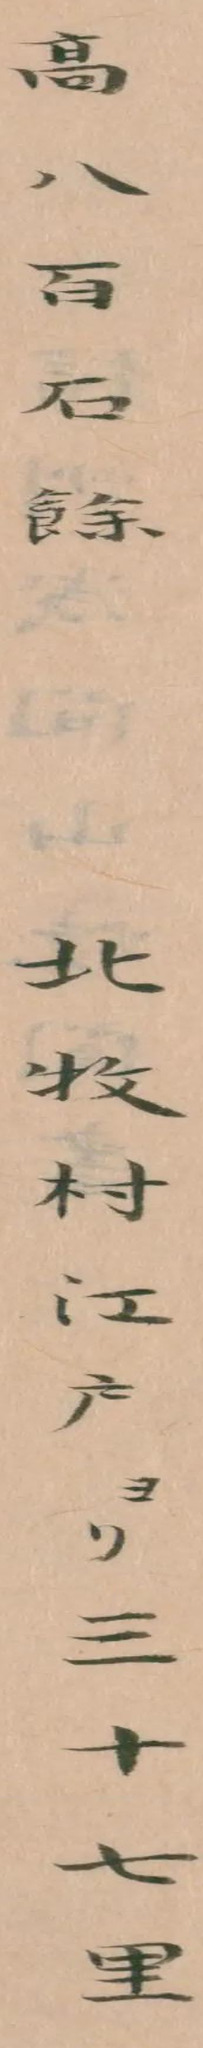高八百石余北牧村江戸ヨリ三十七里
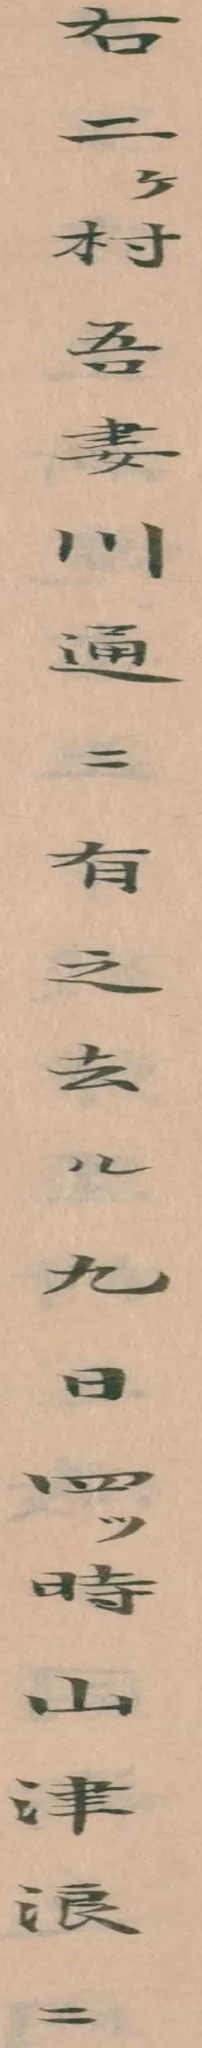右二ヶ村吾妻川通二有之去ㇽ九日四ッ時山津波二
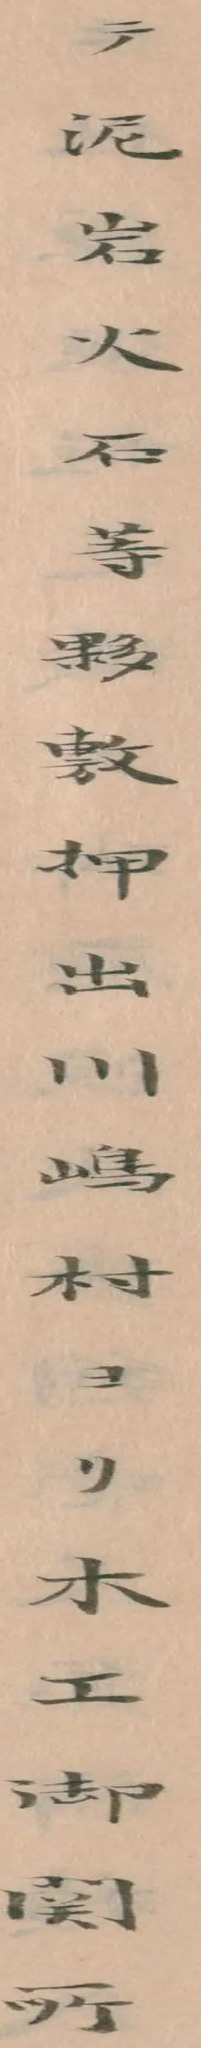テ泥岩火石等夥敷押出川嶋村ヨリ木工御関所
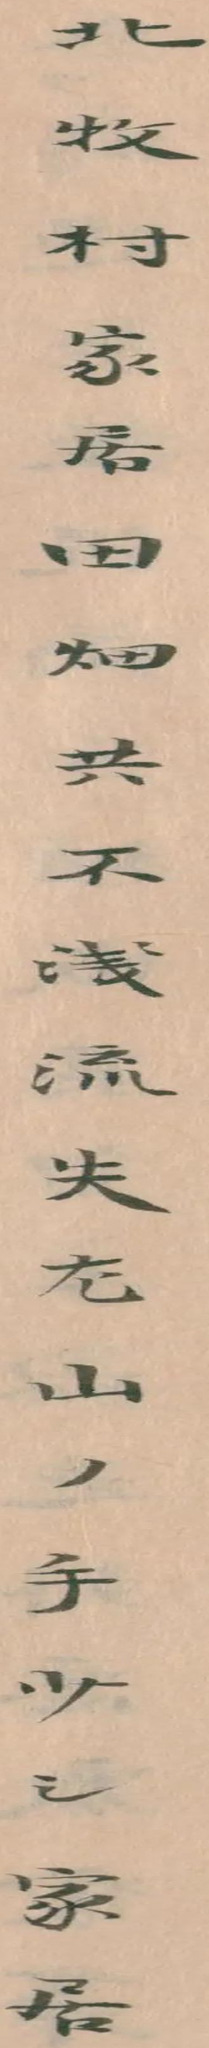北牧村家居田畑共不残流失右山ノ手少シ家居
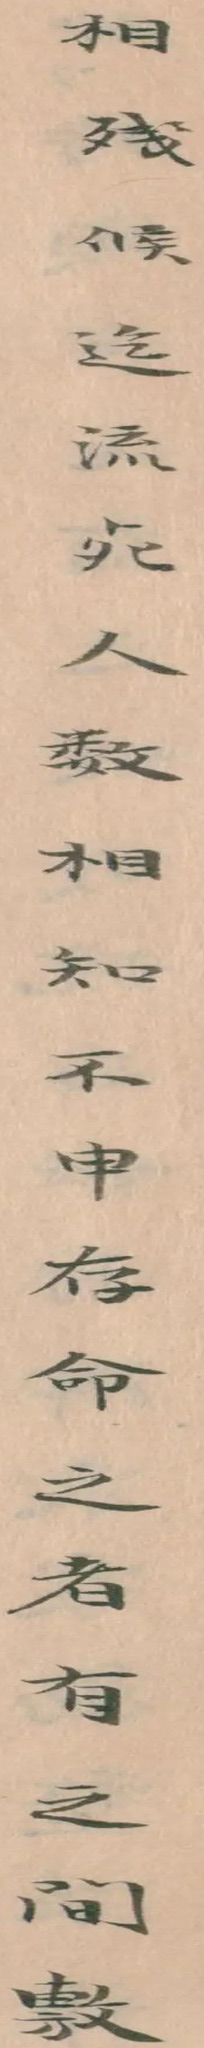相残候迄流死人数相知不申存命之者有之間敷
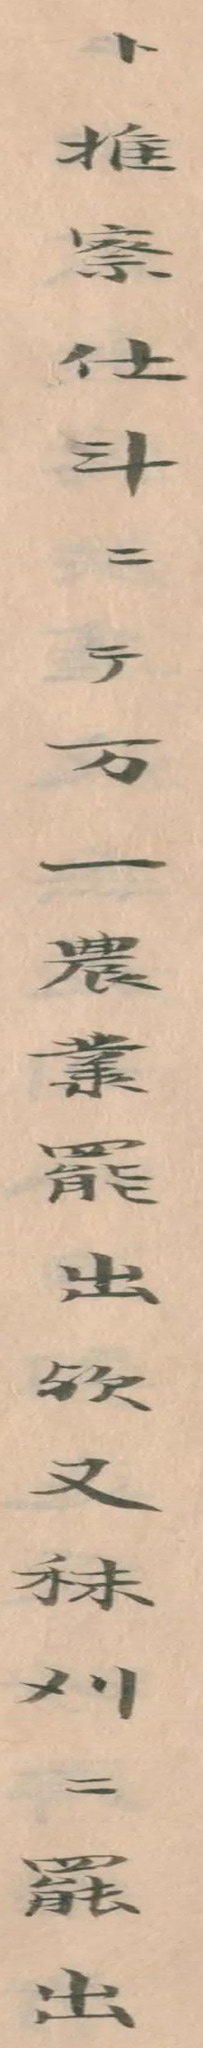ト推察仕斗ニテ万一農業罷出歟又秣刈二罷出
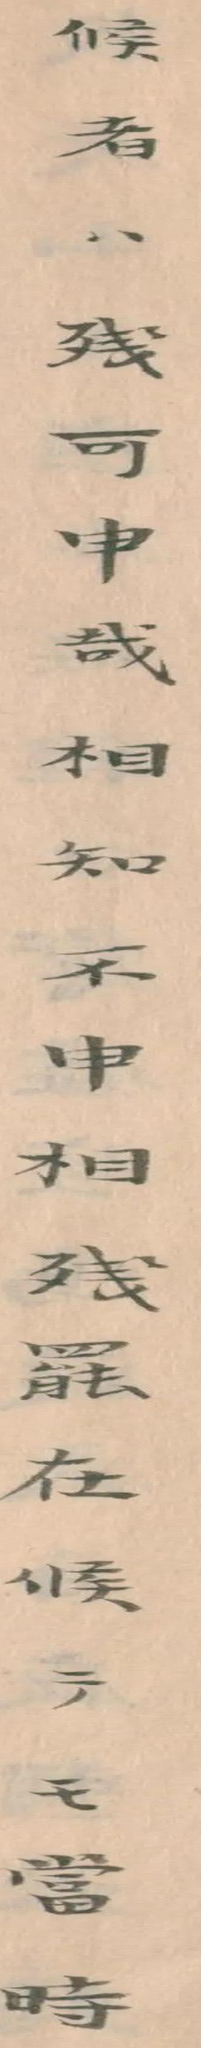候物ハ残可申哉相知不申相残罷在候テモ当時
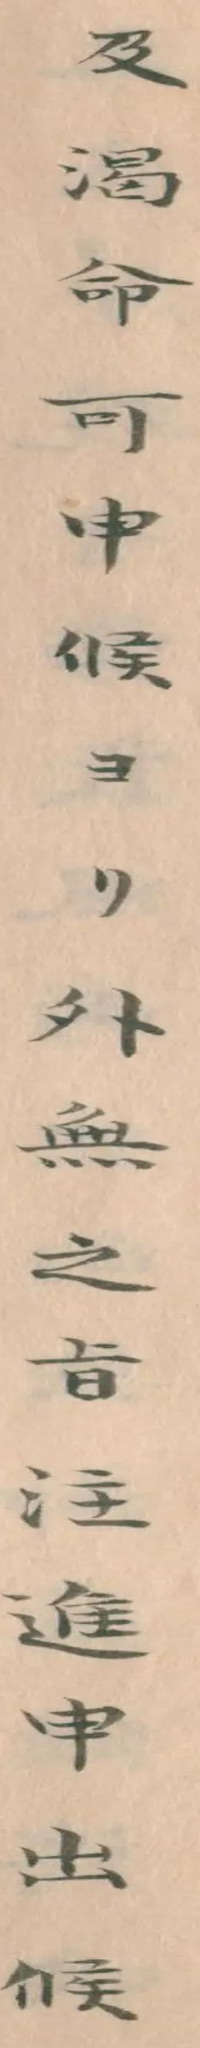及渇命可申候ヨリ外無之旨注進申出候
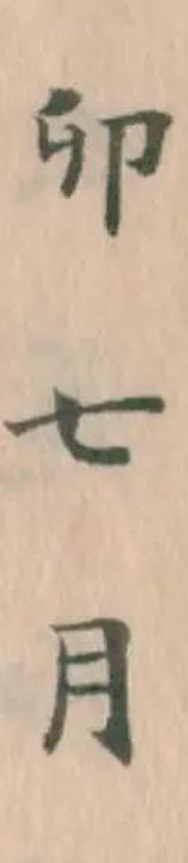卯七月
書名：地災撮要. 巻1(噴火山・地震ノ部)
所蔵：国立国会図書館 National Diet Library, JAPAN
